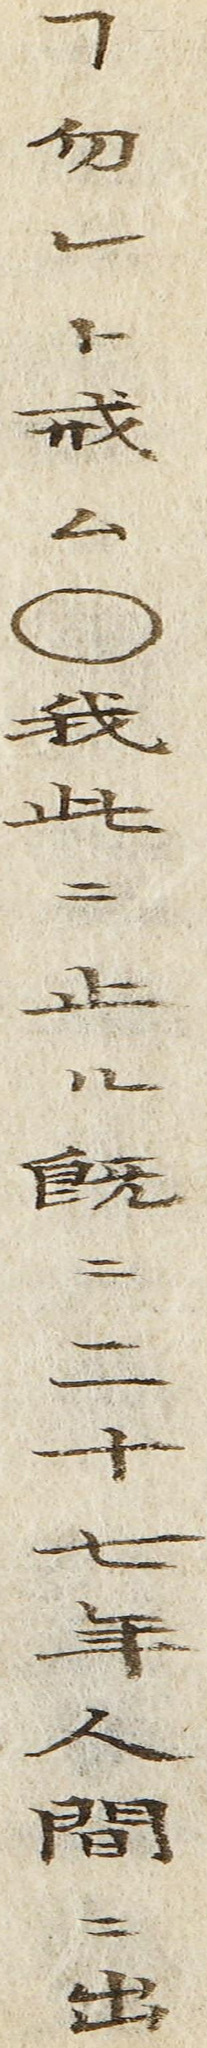コト勿レト戒ム◯我此ニ止ル既ニ二十七年人間ニ出
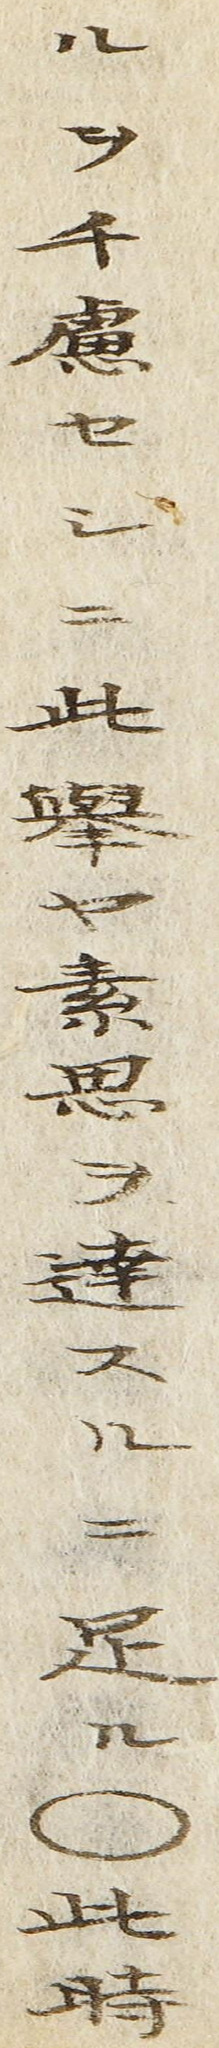ルヲ千慮セシニ此挙ヤ素思ヲ達スルニ足ル◯此時
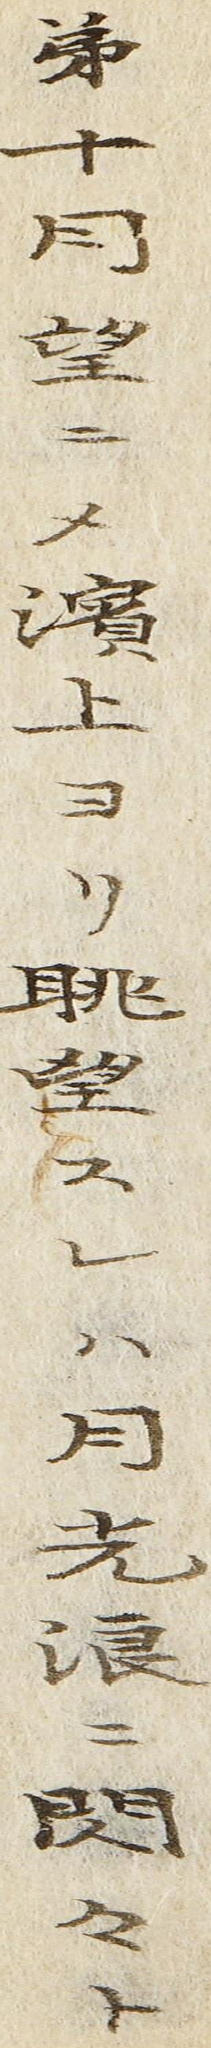第十月望ニシテ浜上ヨリ眺望スレハ月光浪ニ閃々ト
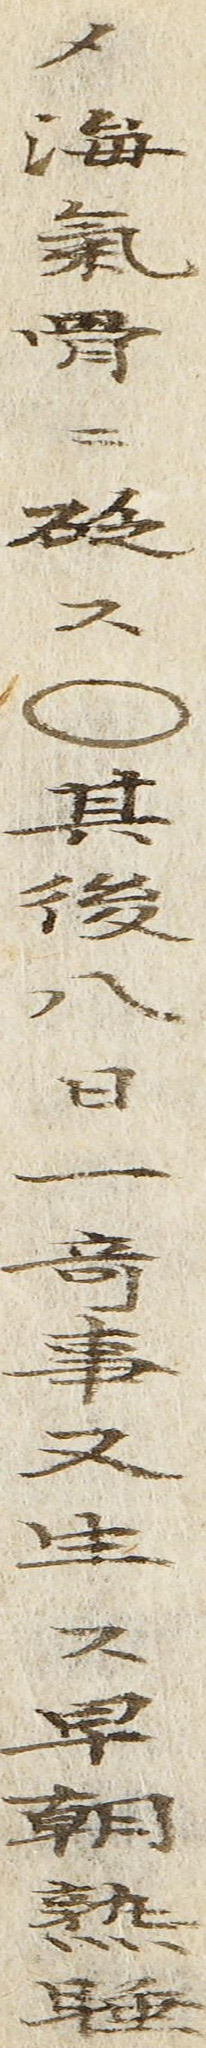シテ海気骨ニ砭ス◯其後八日一奇事又生ス早朝熟睡
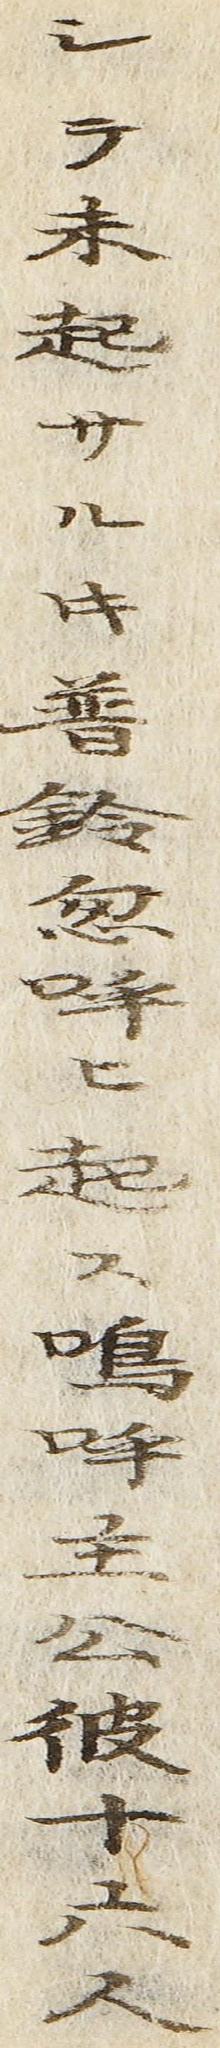シテ未起サルトキ普鈴忽呼ヒ起ス鳴呼主公彼十六人
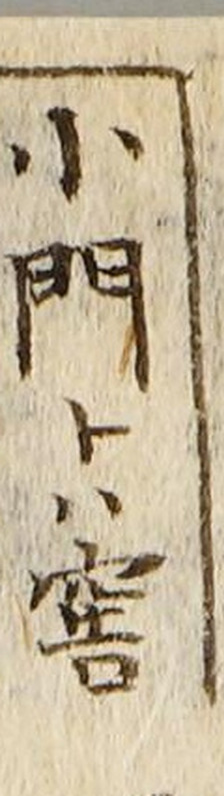小門トハ窖
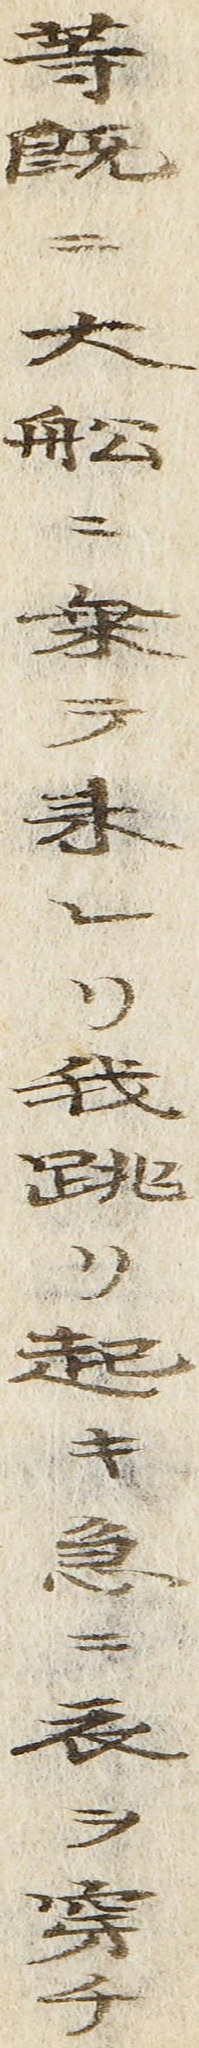等既ニ大船ニ乗テ来レリ我跳リ起キ急ニ衣ヲ穿チ
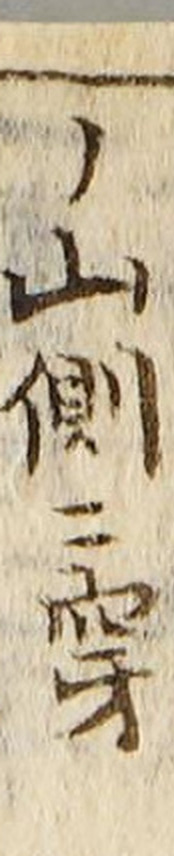ノ山側ニ穿
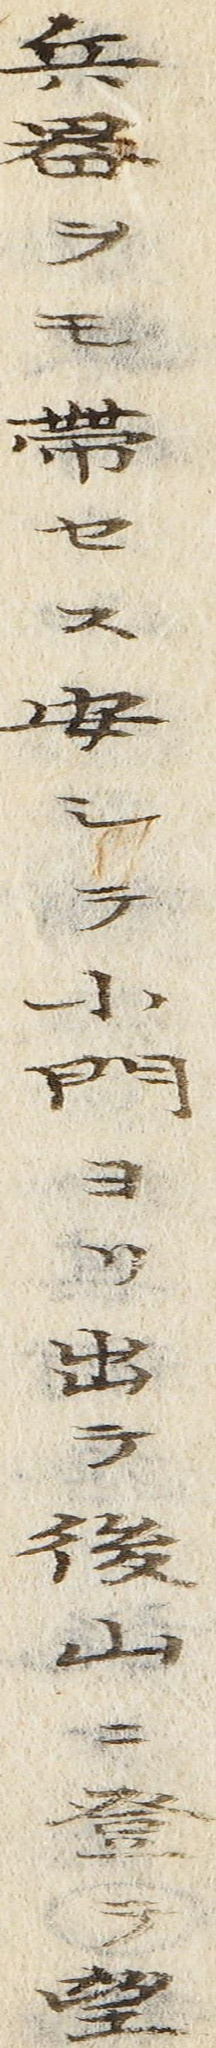兵器ヲモ帯セス安シテ小門ヨリ出テ後山ニ登テ望
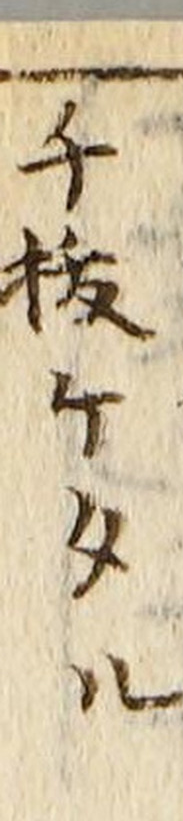チ抜ケタル
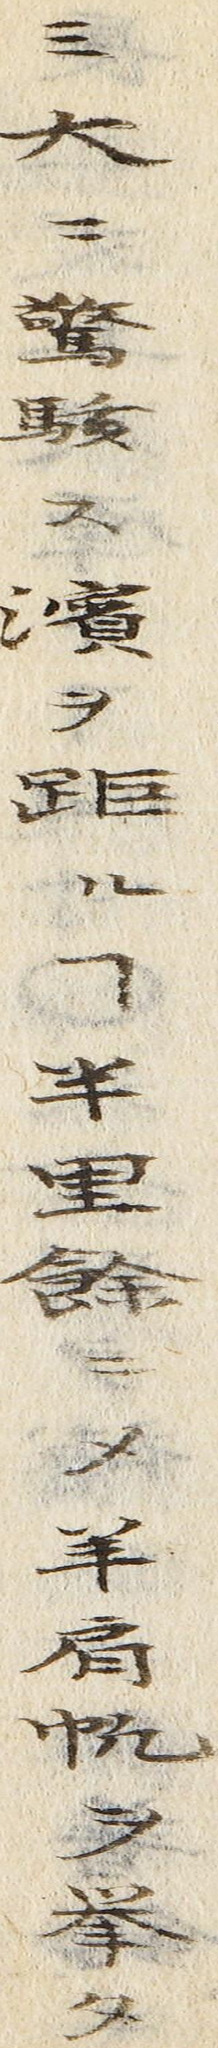ミ大ニ驚駭ス浜ヲ距ルコト半里余ニシテ羊肩帆ヲ挙タ
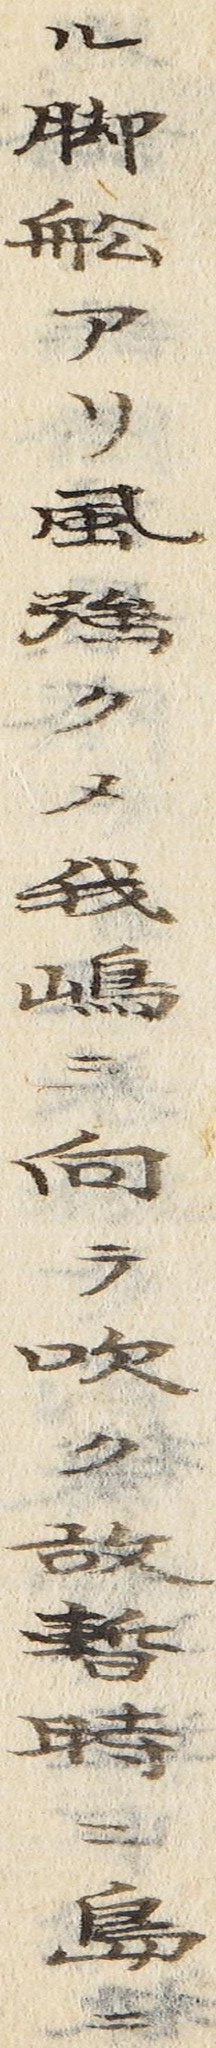ル脚船アリ風強クシテ我嶋ニ向テ吹ク故暫時ニ島ニ
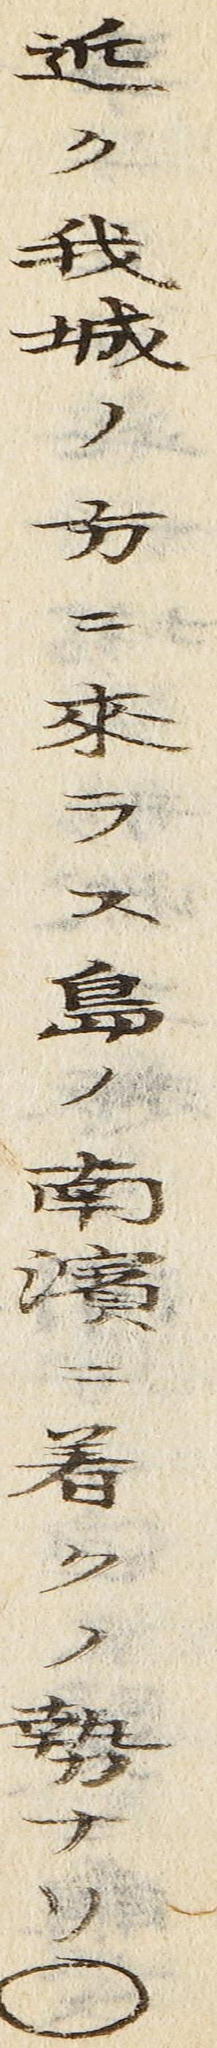近ク我城ノ方ニ来ラス島ノ南浜ニ着クノ勢ナリ◯
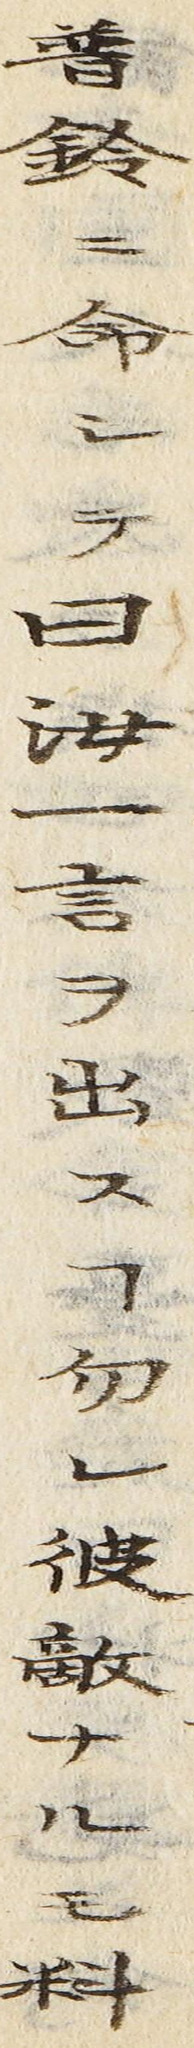普鈴ニ命シテ曰汝一言ヲ出スコト勿レ彼敵ナリモ料
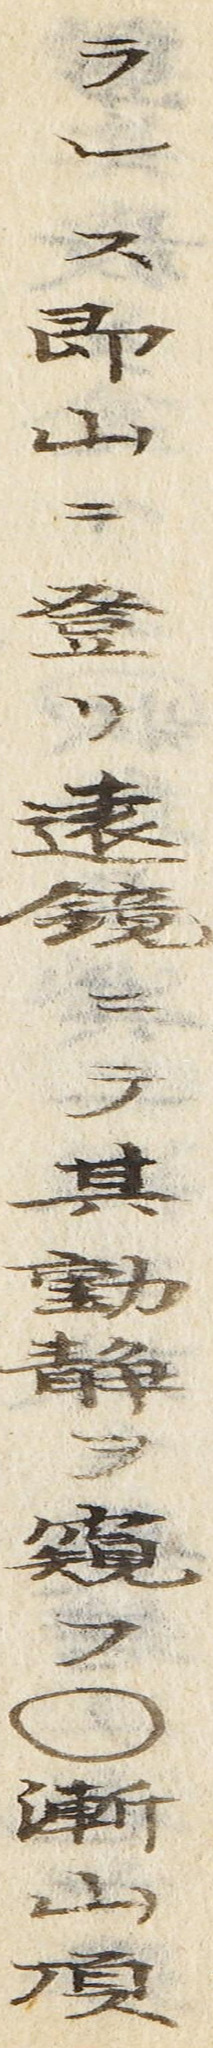ラレス即山ニ登リ遠鏡ニテ其動静ヲ窺フ◯漸山頂
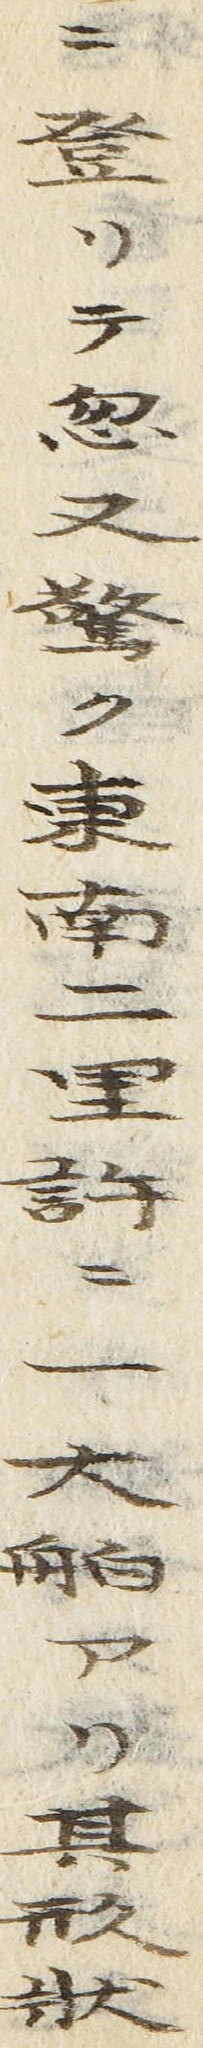ニ登リテ忽又驚ク東南二里許ニ一大舶アリ其形状
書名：漂流紀事
